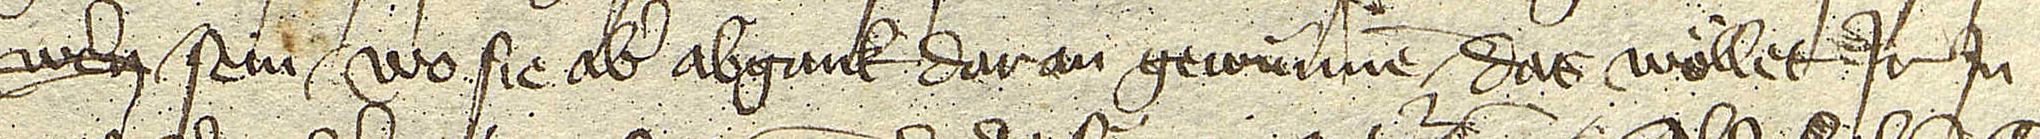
we*n / ſein / wo ſie ab* abgank daran gewünne* / das wöllet Ir In
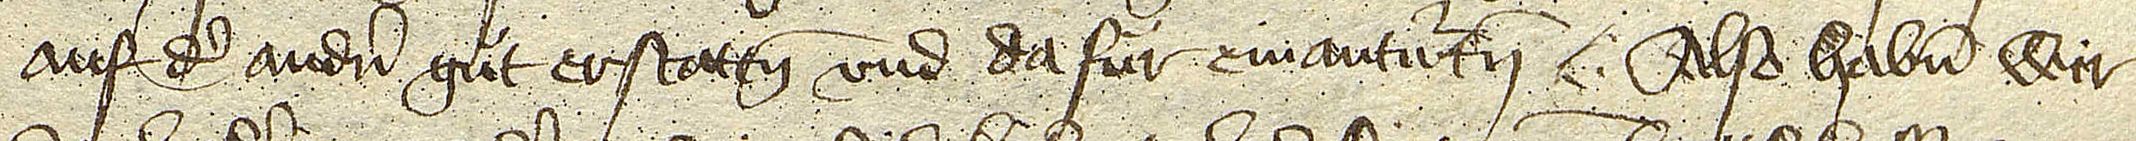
auf d* andn* güt erſtattn* vnd da für ein antw*tn* / . Alſo habn* wir
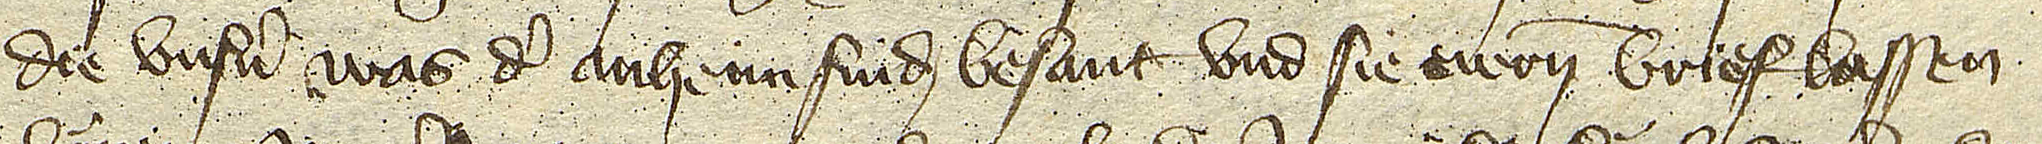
die vnſn* was d* anheim ſind beſant vnd ſie ewrn* brief laſſen
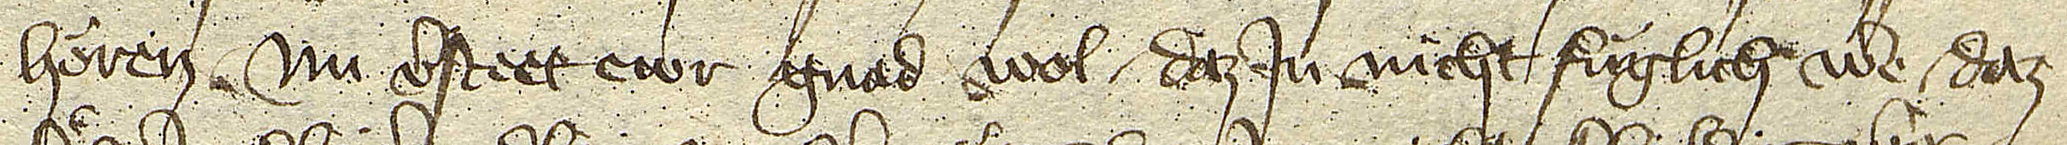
hören / Nu v*ſteet ewr gnad wol / daʒ In nicht füglich w*e / daʒ
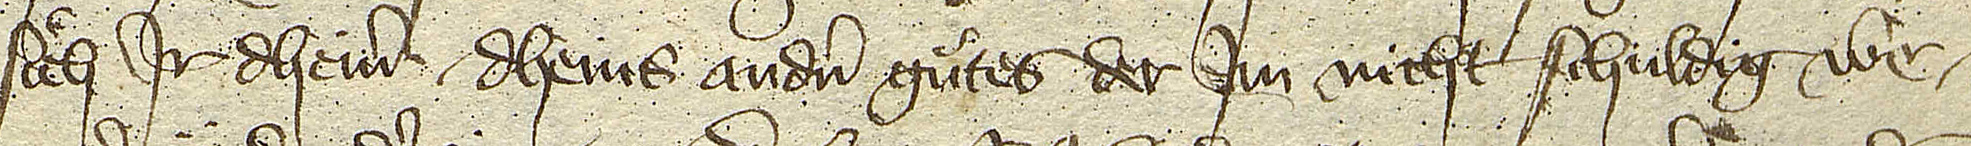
ſich Ir dhein* / dheins andn* gütes der Im nicht ſchuldig w*e /
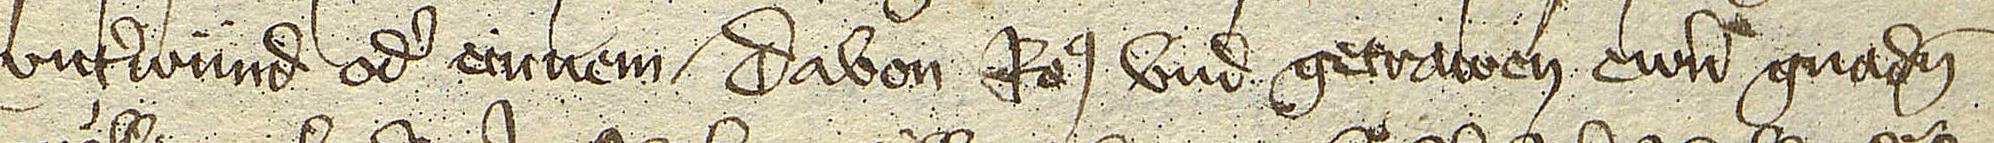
vnt*wünd od* einnem / Davon Ro* vnd getrawen ewn* gnadn*
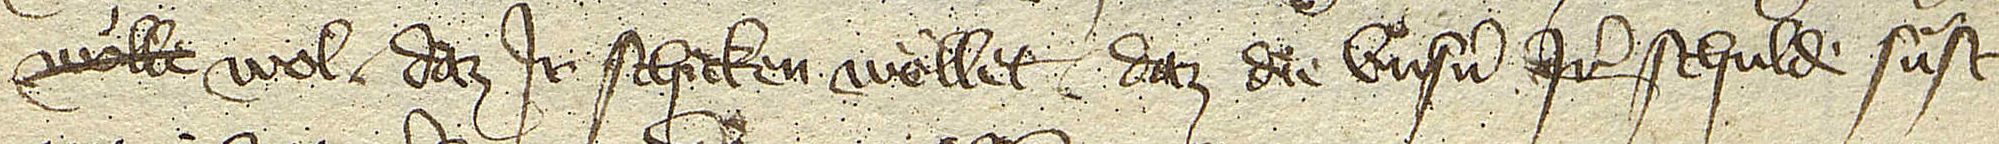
wölle wol / daʒ Ir ſchicken wöllet / daʒ die vnſn* Ir* ſchulde ſüſt
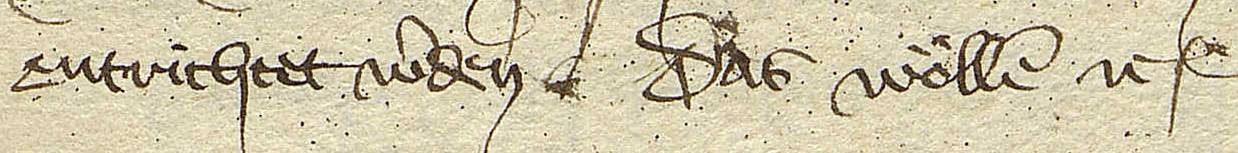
entrichtet w*den / Das wölle* ec*
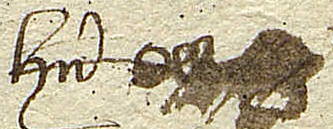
hn* Sweig
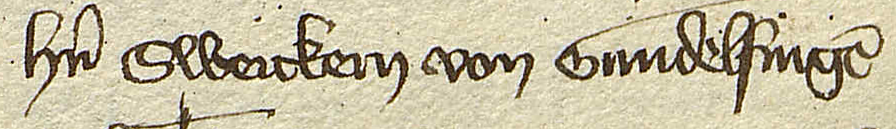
hn* Sweickern von Gündelfinge*
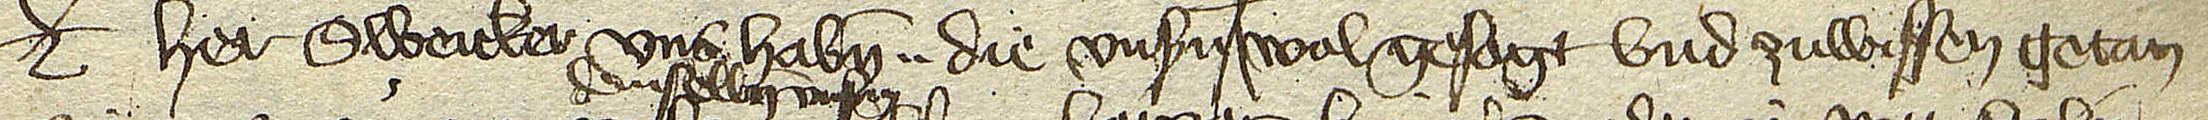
L* her Sweicker vns habn* ~ die vnſ*n wol geſagt vnd ʒuwiſſen getan
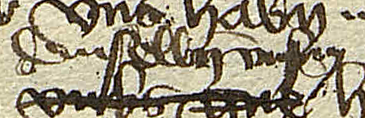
demſelbn* vnſ*m
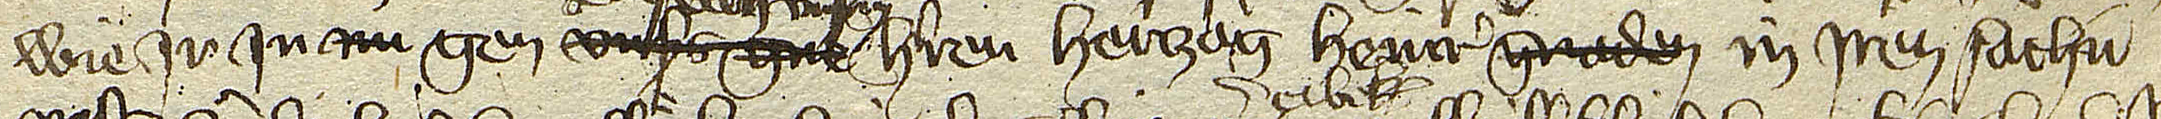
wie Ir In nü gen vnſ*s gne h*ren hercʒog heinr* gnaden in Iren ſachn*
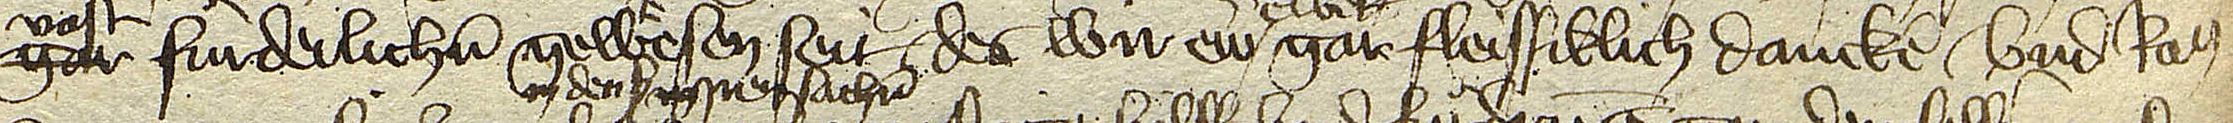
gar fürderlichn* geweſen ſeit / des wir ew* gar fleiſſiklich dancke* / vnd Ro*
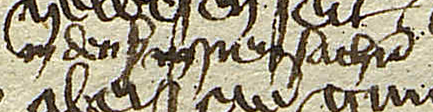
in denſ* in Iren ſachn*
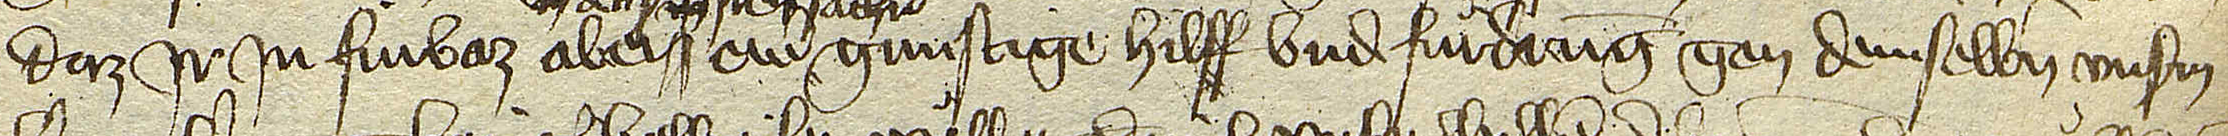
daʒ Ir In fürbaʒ aber ew* gunſtige hilff vnd fürdrug* gen demſelbn* vnſ*m
